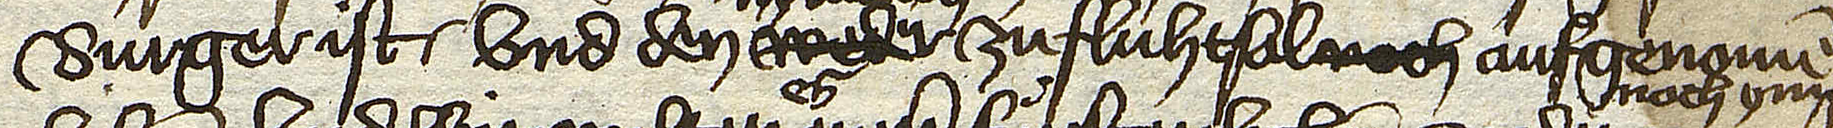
Burger iſt / vnd den weder cʒu fluhtſal noch aufgenome*
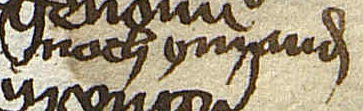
noch ymand*
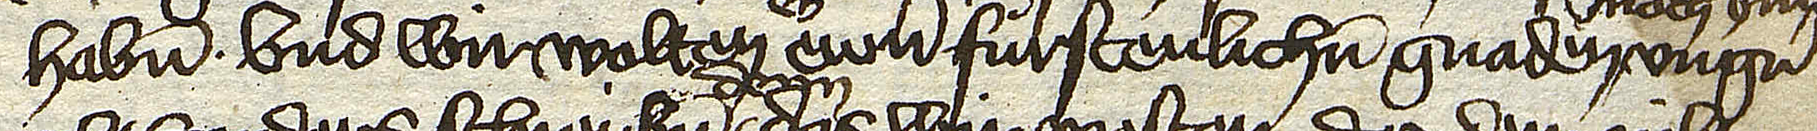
hab*n . vnd wir wolten ew*n fürſtenlich*n gnaden vng*n
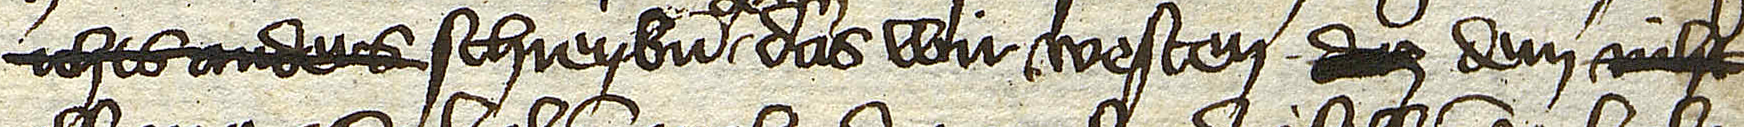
ichts anders ſchreib*n / das wir weſten . daʒ dem niht
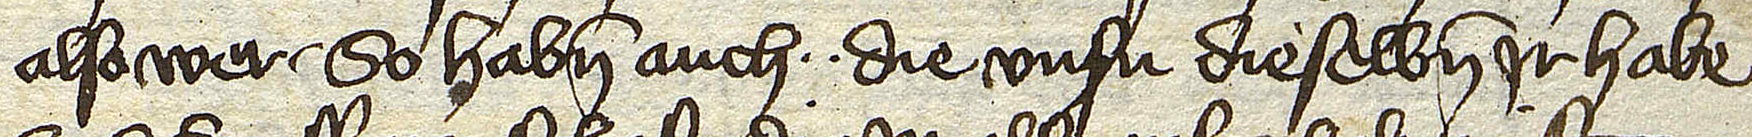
alſo wer / So hab*n auch ~ die vnſ*n dieſelb*n Ir habe
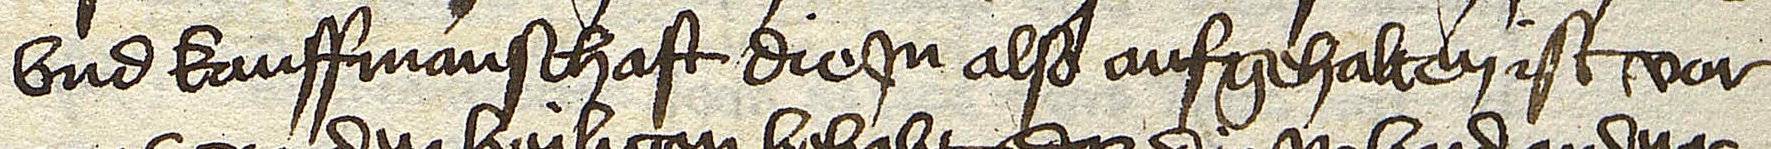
vnd kauffmanſchaft die In alſo aufgehalten iſt vor
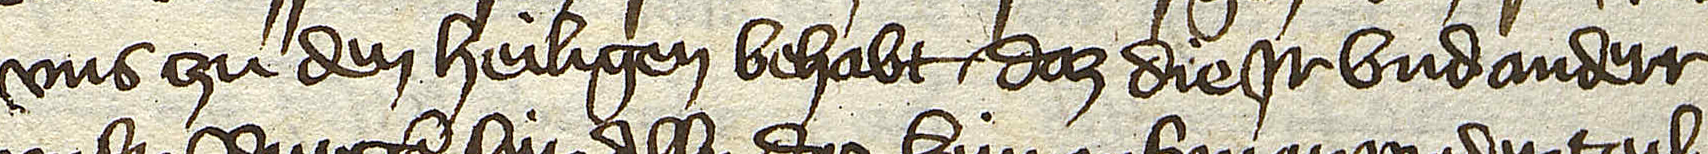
vns cʒu den heiligen behabt / daʒ die Ir vnd anderr
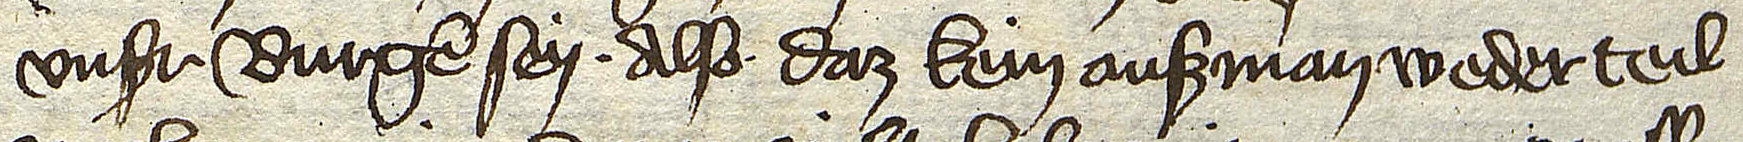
vnſ*r Burge* ſey . Alſo daʒ kein auſʒman weder teil
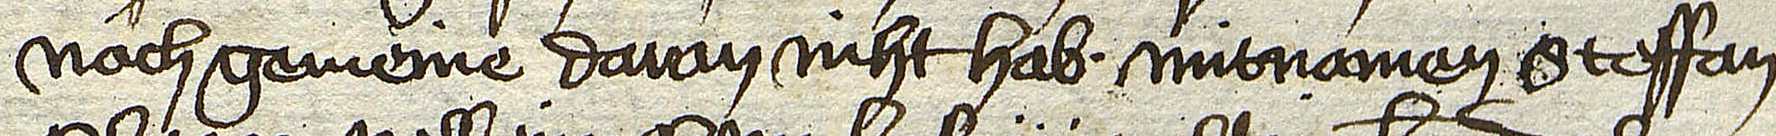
noch gemeine daran niht hab . mitnamen Steffan
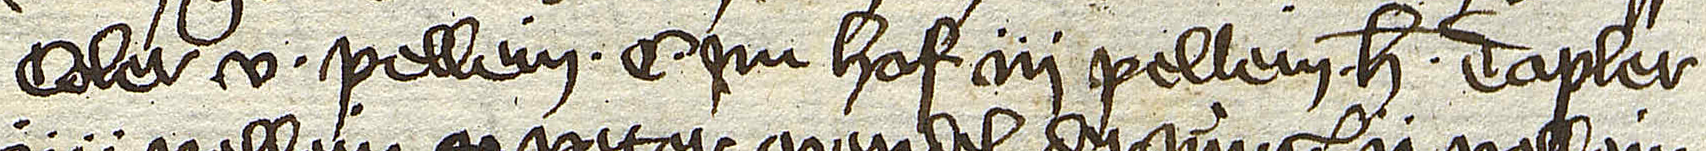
Coler v . pellein . C. Im hof iii pellein . H . Topler
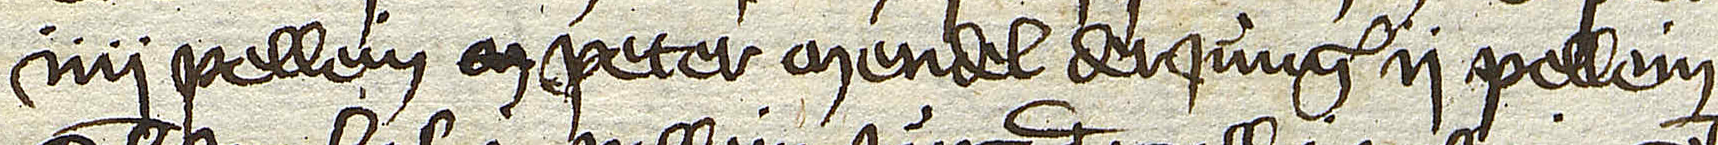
iiii pellein M peter Mendel der Iüng* ii pellein
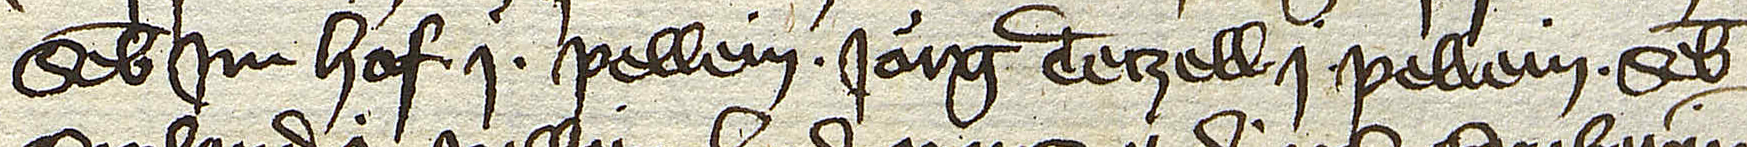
Seb* Im hof . i . pellein . Iörg Tecʒell . i . pellein . Seb*
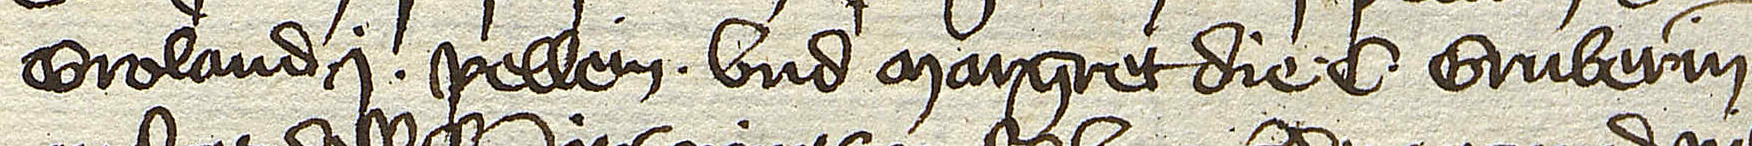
Groland . i . pellein . vnd Margret die . C . Gruberin*
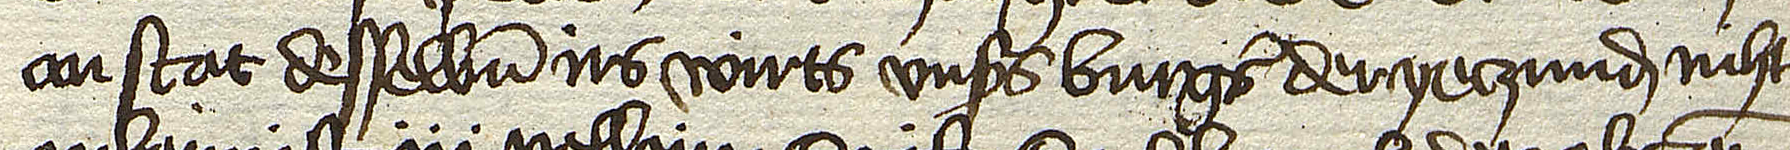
an ſtat deſſelb*n irs wirts vnſ*s burg*s der yecʒund* niht
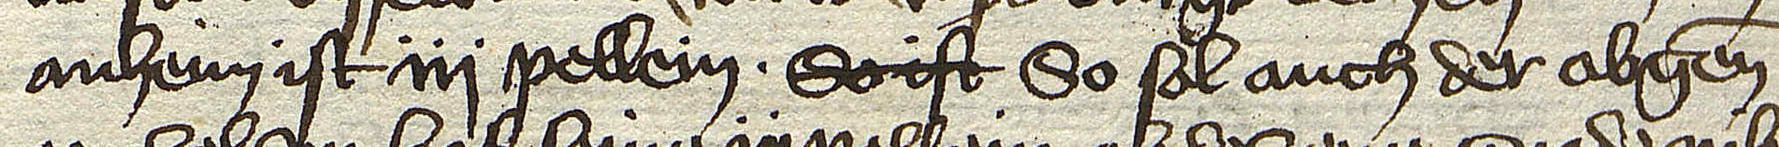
anheim iſt iii pellein . So iſt So ſol auch der obgen*
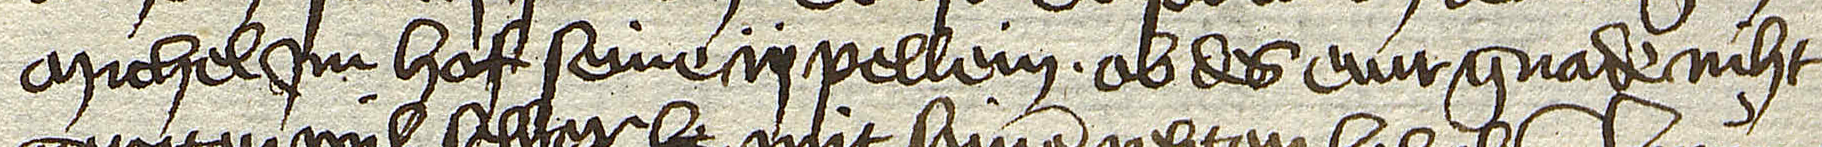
Michel Im hof ſeine ii pellein . ob des ewr gnade niht
